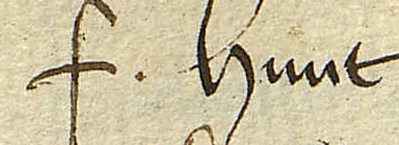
F. Hunt
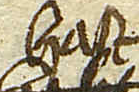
haſt
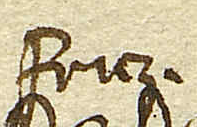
Fricʒ .
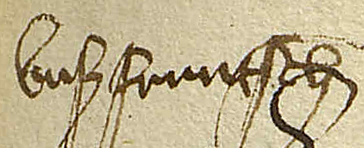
vnſ* fruntſch*
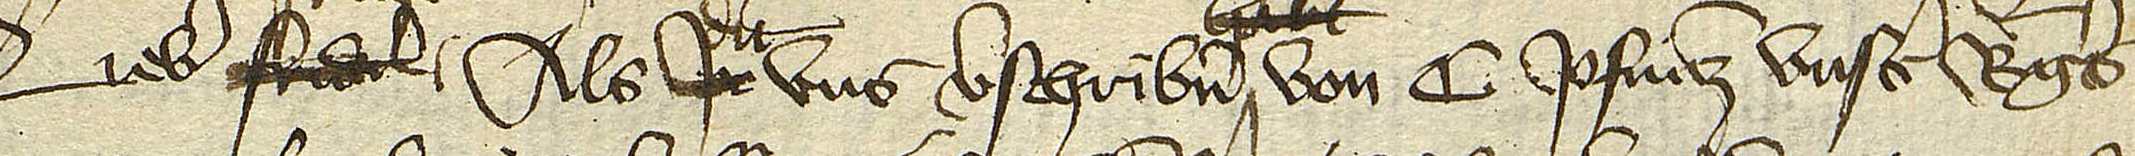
Lieb* fridr* / Als Ir vns v*ſchribn* von C . Pfincʒ* vnſs* B*g*s
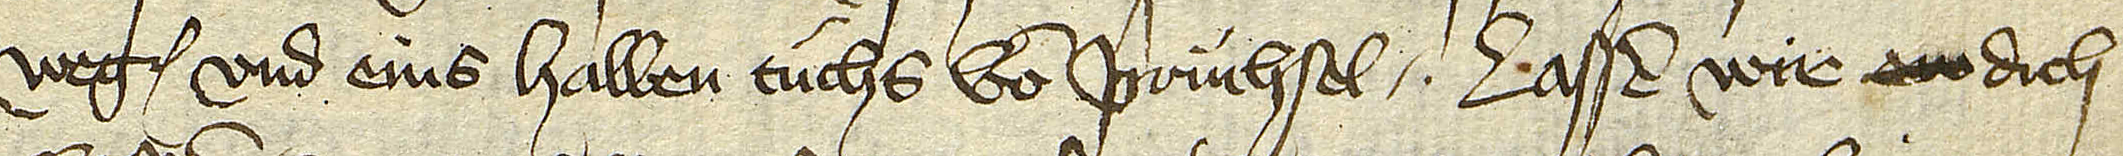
weg* vnd eins halben tüchs vo* Prüchſel / . Laſſe* wir ew dich
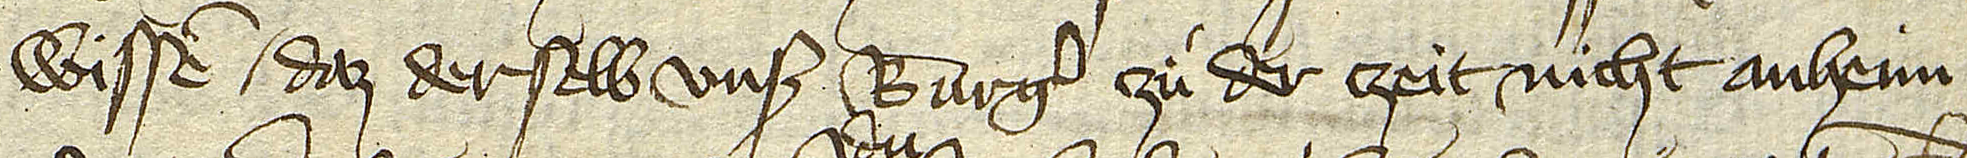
wiſſe* / daʒ derſelb vnſ* Burg* cʒü der cʒeit nicht anheim
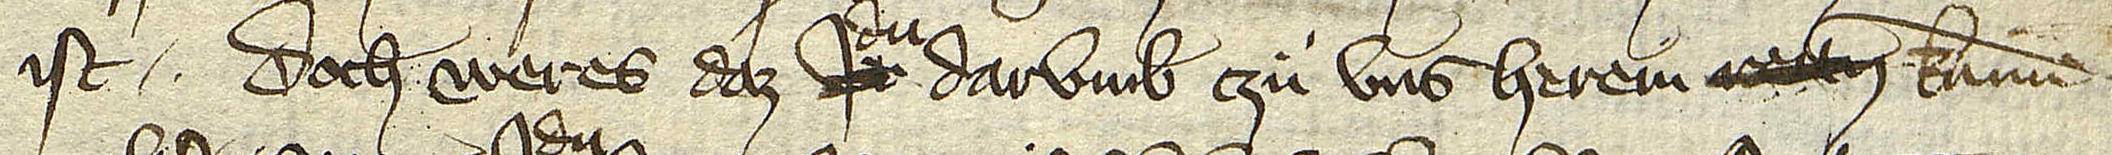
iſt / . Doch weres daʒ Ir darvmb cʒü vns herein reitn* kume*
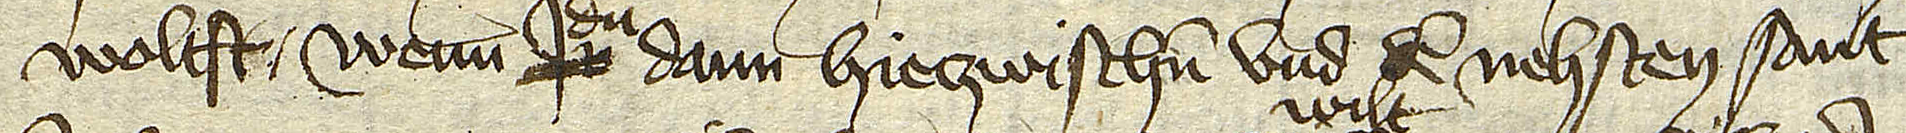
woltſt / wenn Ir dann hiecʒwiſchn* vnd d* nehſten ſant
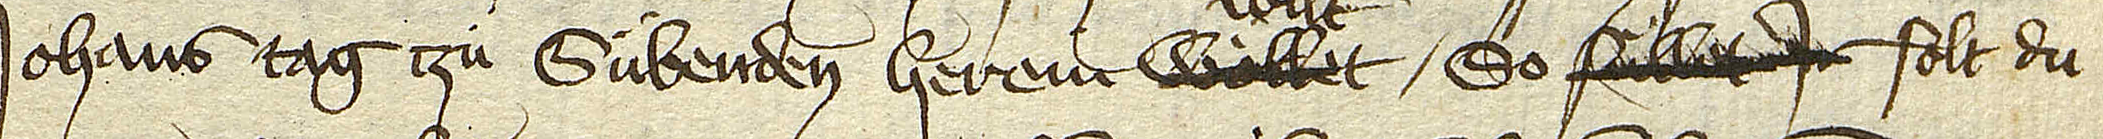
Iohans tag cʒü Sübenden herein wöllet / So ſüllet Ir ſolt du
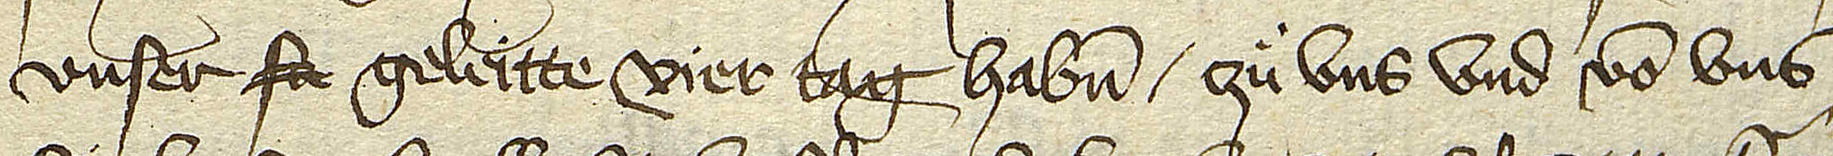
vnſer ſi geleitte vier tag habn* / cʒü vns vnd vo* vns
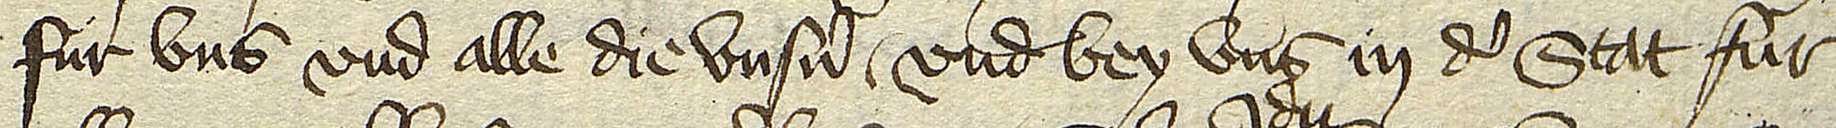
für vns vnd alle die vnſn* / vnd bey vns in d* Stat für
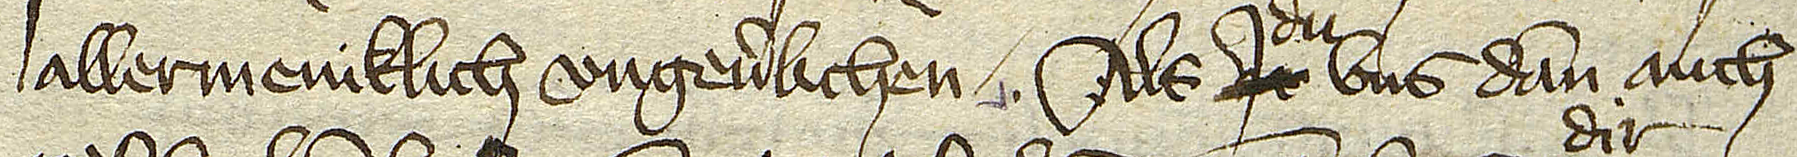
allermeniklich vngeu*lichen / . Als Ir vns dan* auch
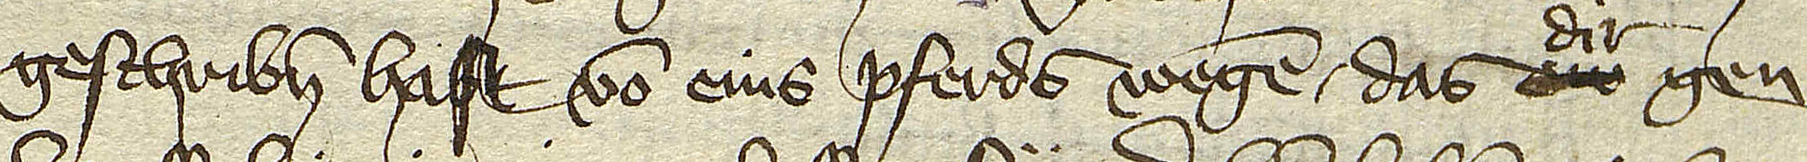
geſchribn* haſt vo* eins pferds wege* / das ew gen
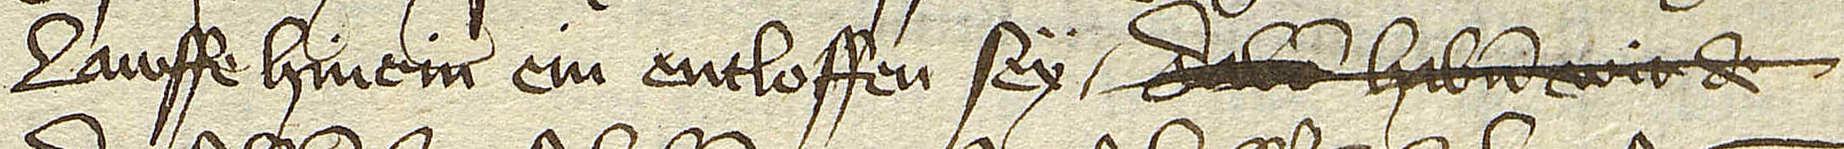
Lawffe hinein ein entloffen ſey / Davo* habn* wir de
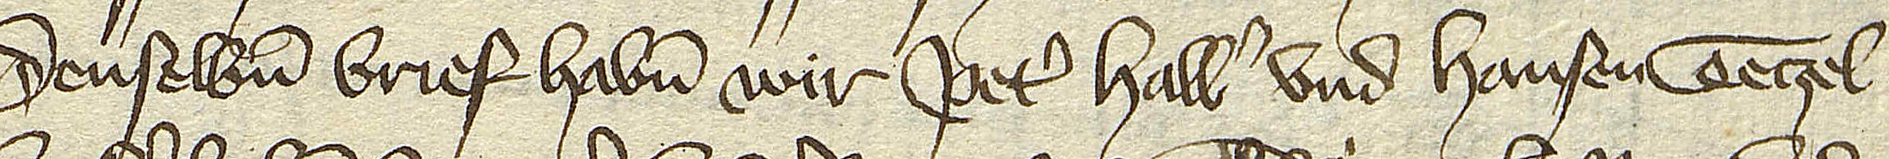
Denſelbn* brief habn* wir Pet* Hall* vnd Hanſen Tecʒel
